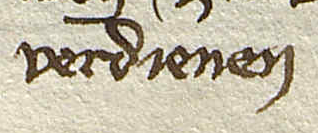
verdienen
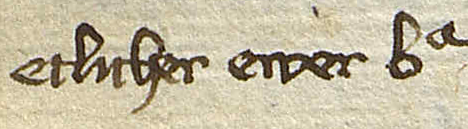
etlicher ewer b*
